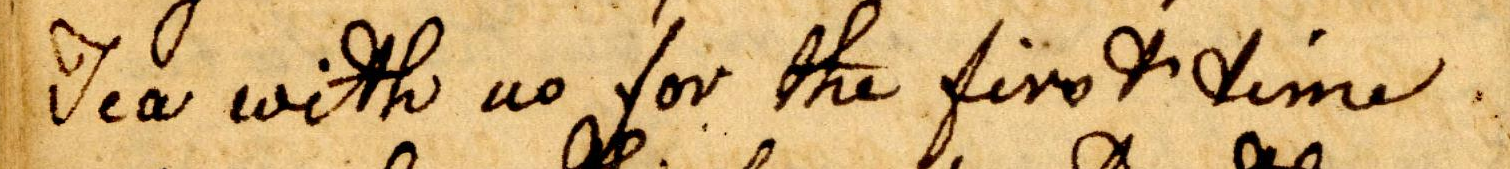Tea with us for the first time
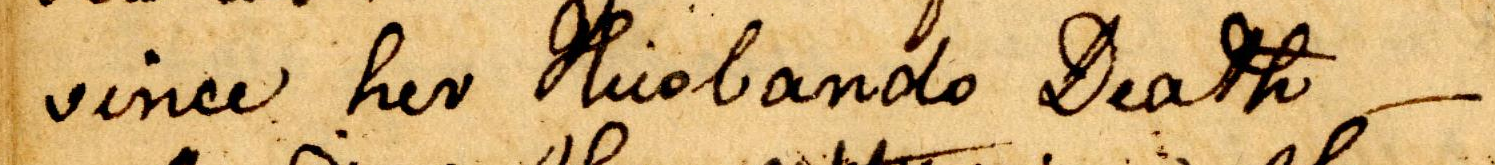since her Husbands Death-
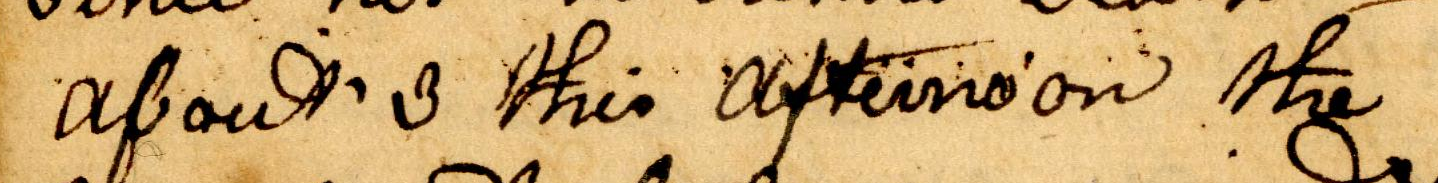about 3 this Afternoon the
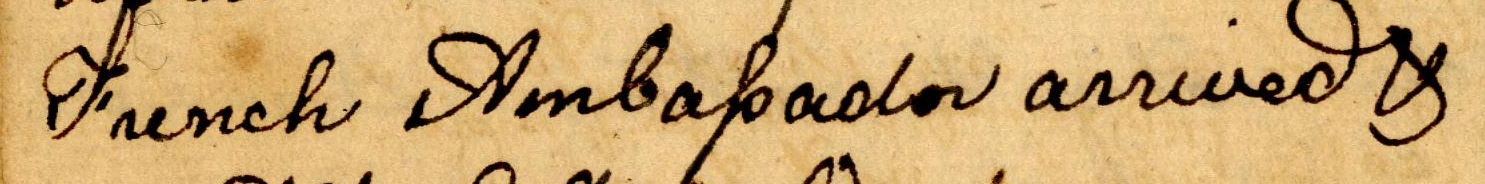French Ambassador arrived &
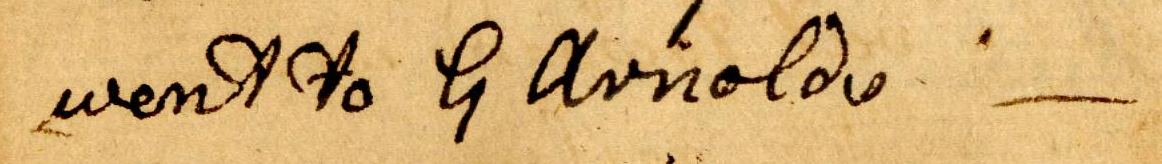went to G Arnolds-
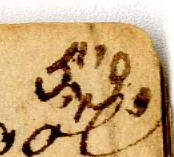53
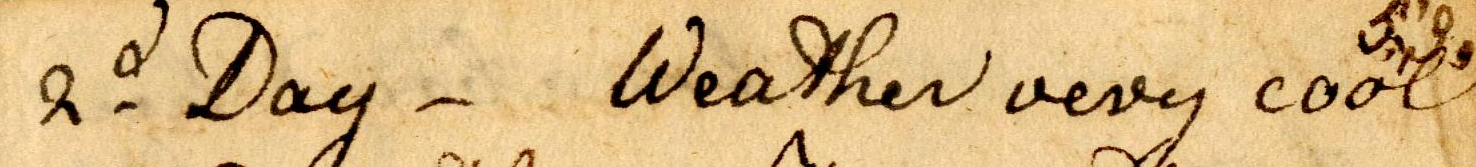2^d Day- Weather very cool
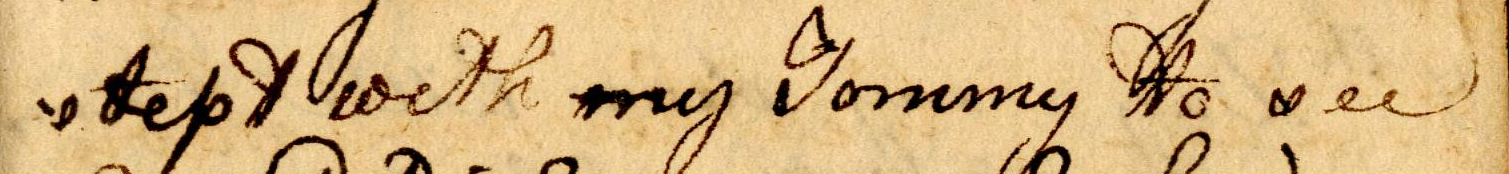stept Iwith my Tommy to see
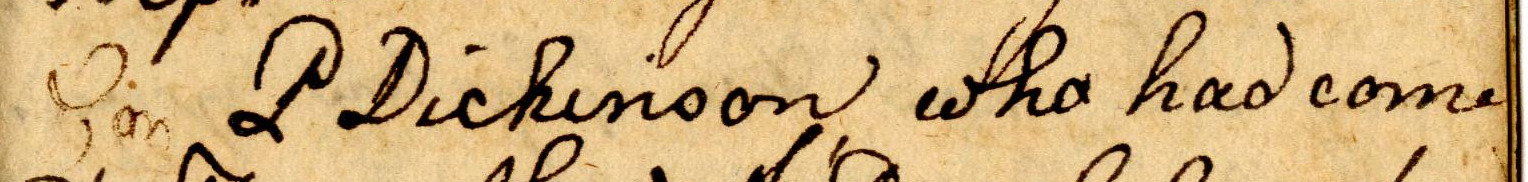Coz P Dickinson who had come
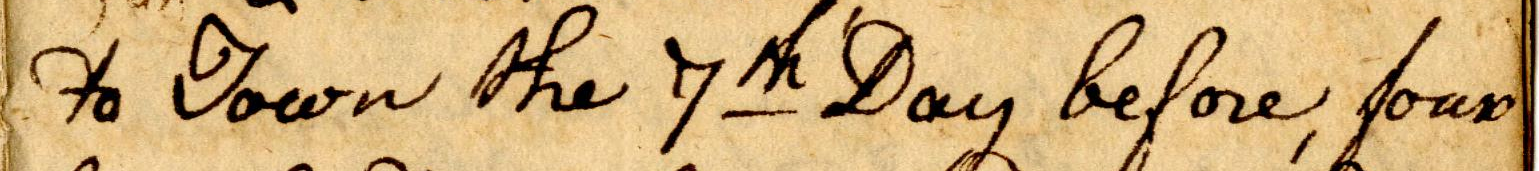to Town the 7^th Day before, foun
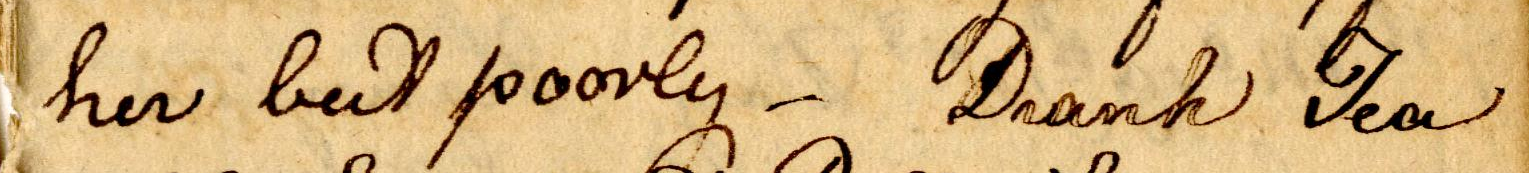her but poorly- Drank Tea
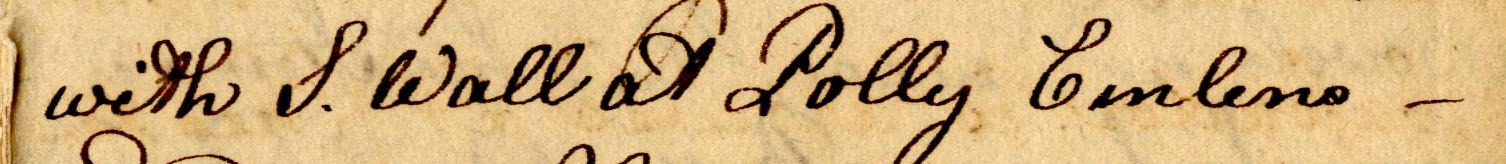with S. Wall at Polly Emlens-
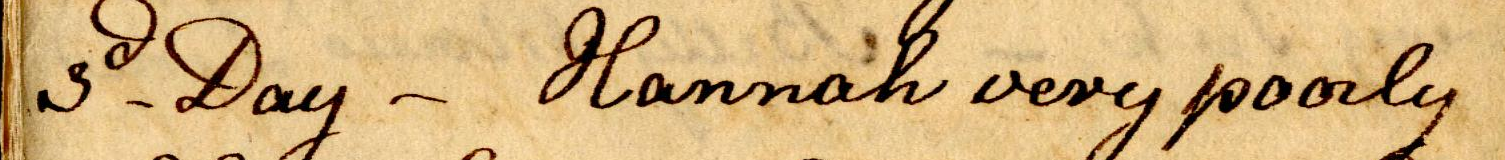3^d Day- Hannah very poorly
